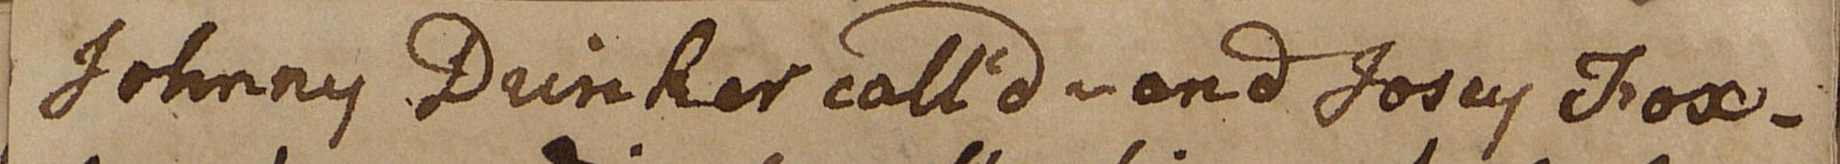Johnny Drinker call'd- and Josey Fox-
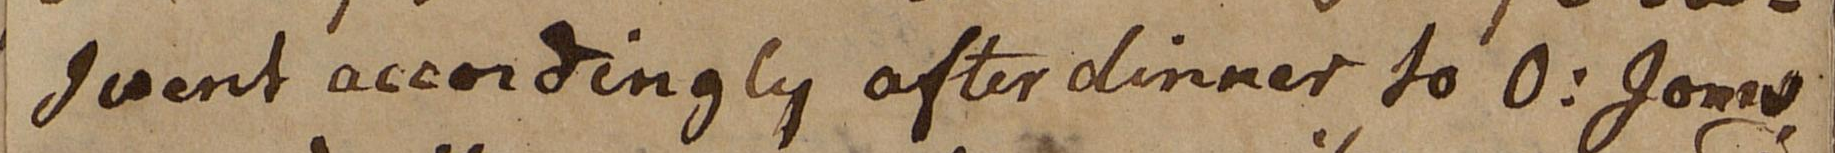I went accordingly after dinner to O: Jones
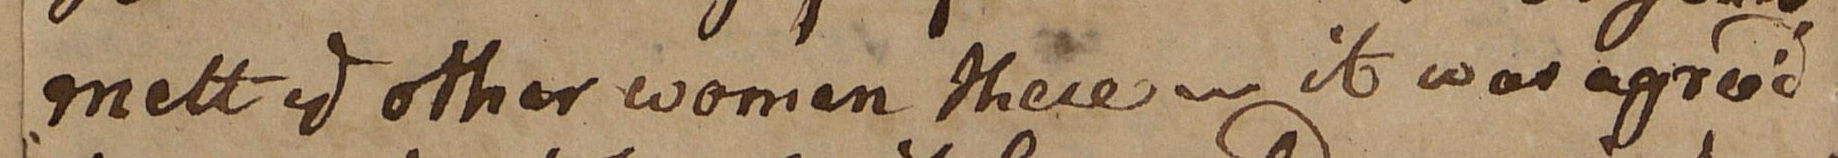mett y^e other women there-- it was agree'd
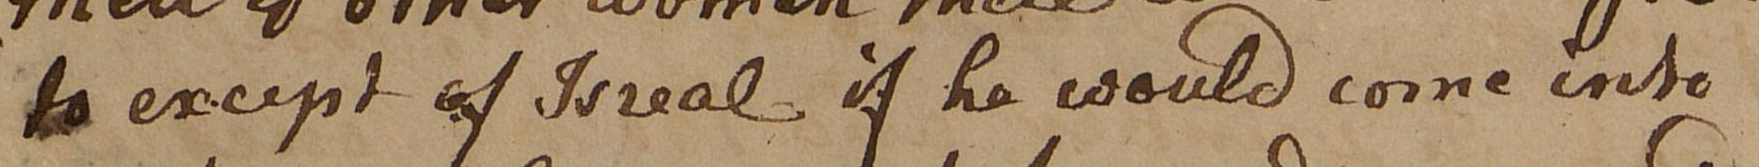to except of Isreal. if he would come into
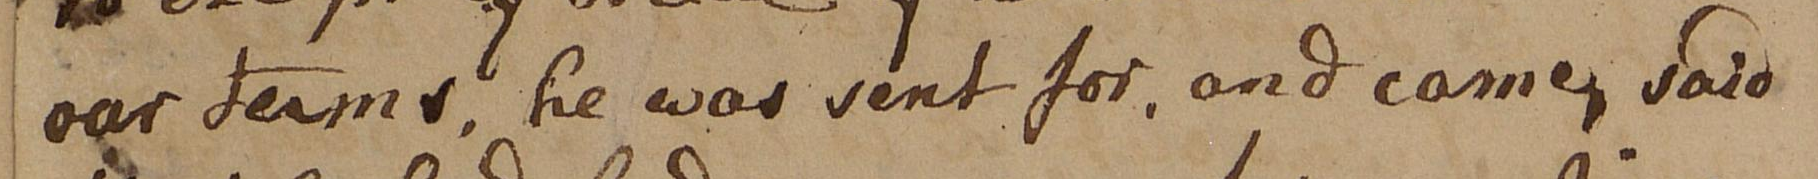our terms, he was sent for, and came, said
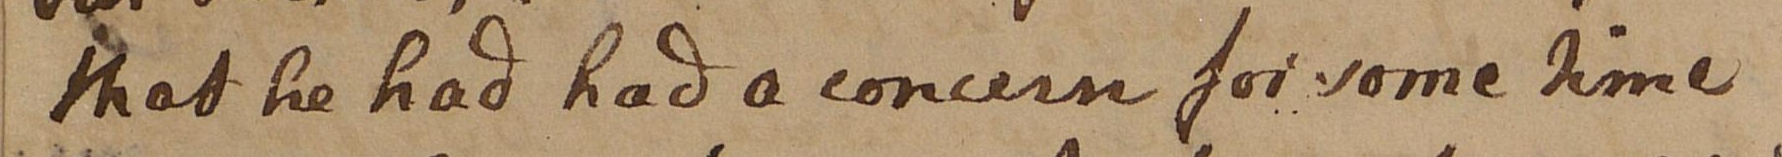that he had had a concern for some time
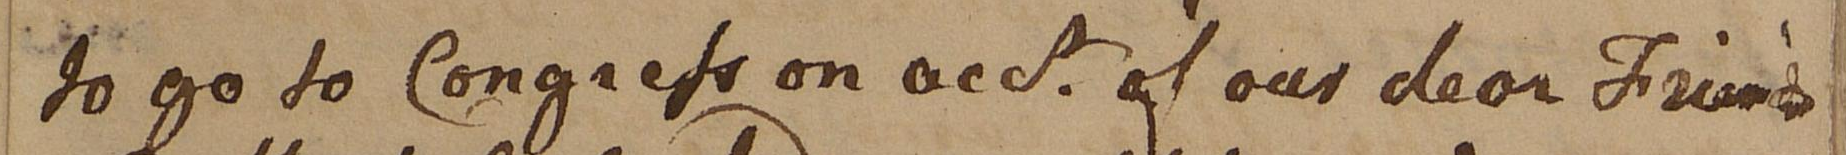to go to Congress on acc^t. of our dear Friends
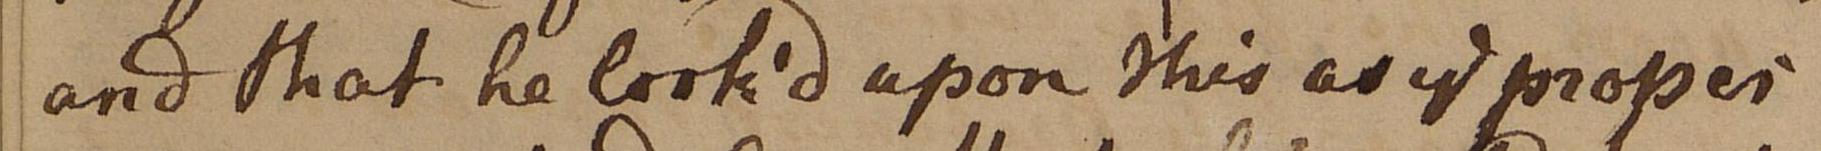and that he look'd upon this as y^e proper
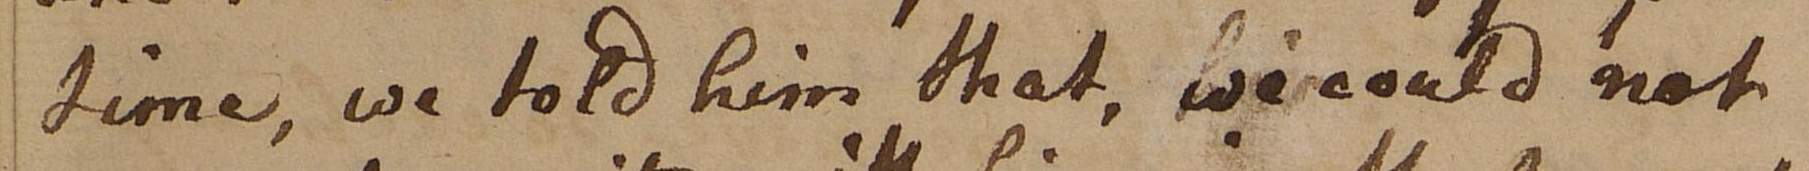time, we told him that we could not
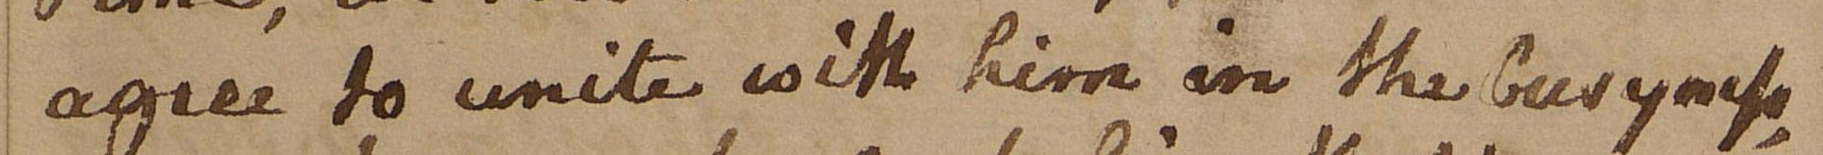agree to unite with him in the busyness,
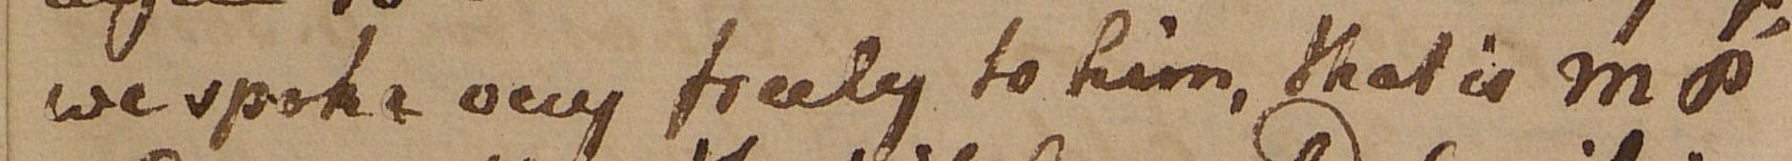we spoke very freely to him, that is M P
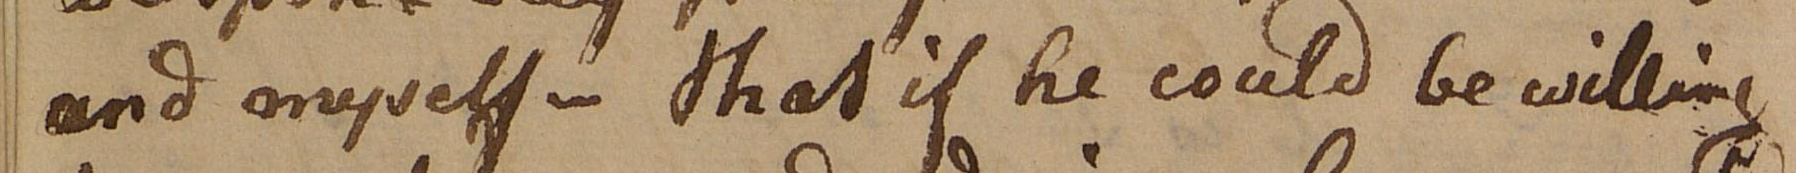and myself- that if he could be willing
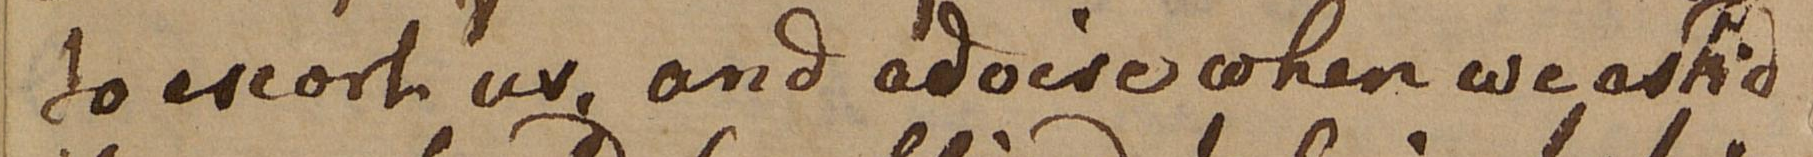to escort us, and advise when we ask'd
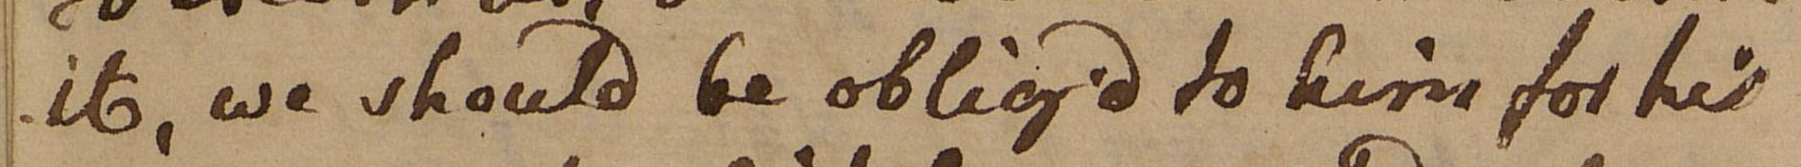its, we should be oblig'd to him for his
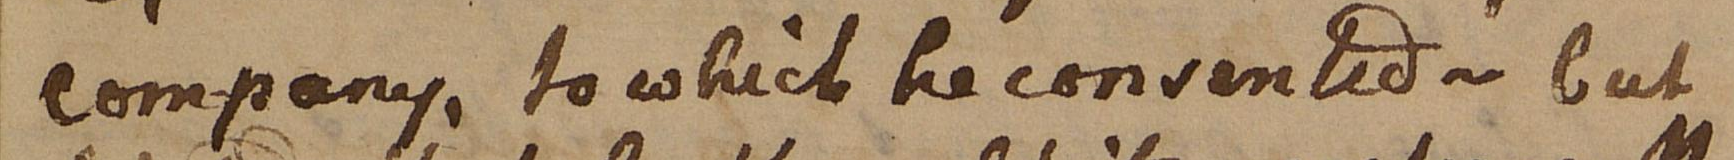company, to which he consented- but
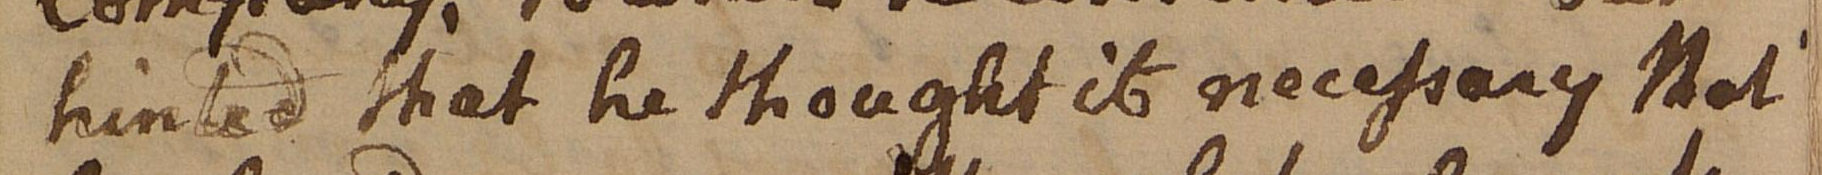hinted that he thought it necessary that
